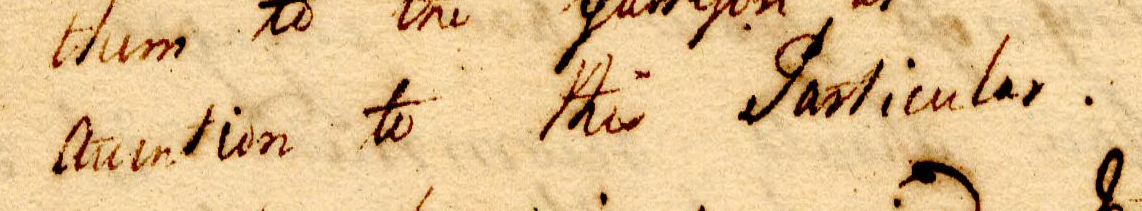Attention to this Particular.
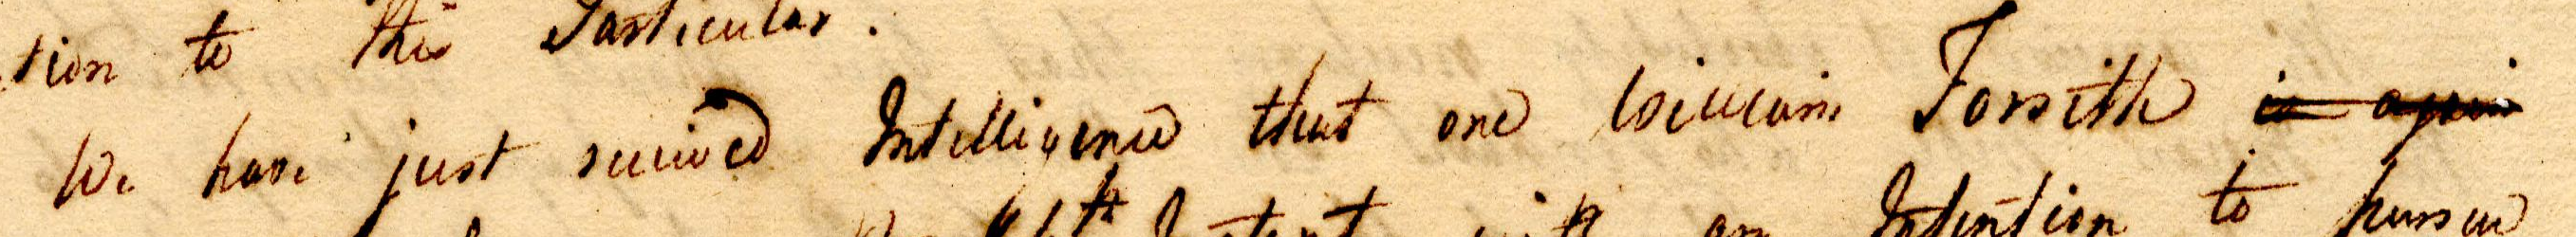We have just received Intelligence that one William Forsith is again
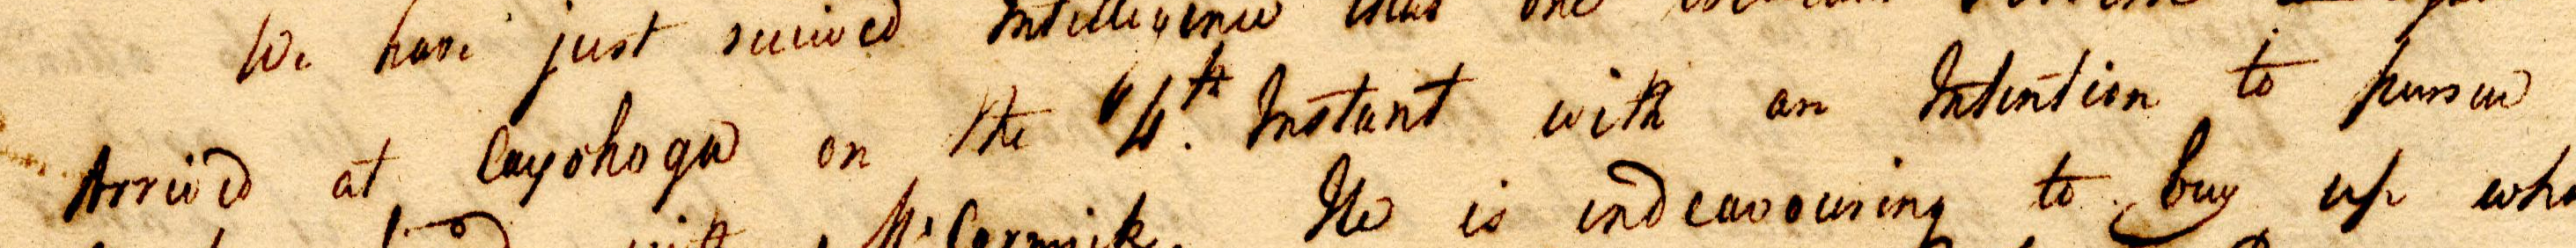Arrived at Cayohoga on the 4^th. Instant with an Intention to pursue
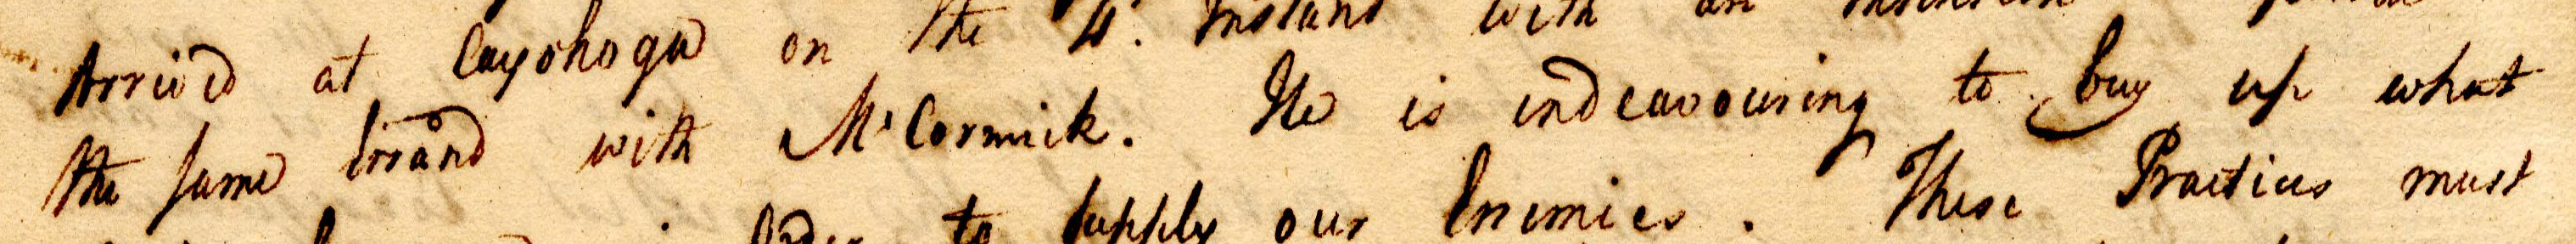the same Errand with M^cCormick. He is endeavouring to buy up what
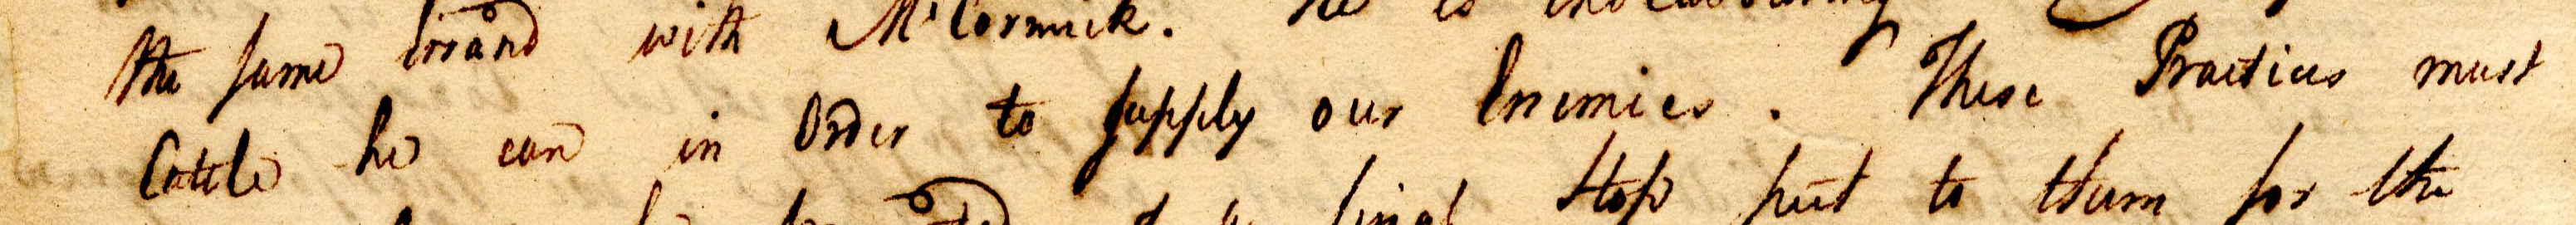Cattle he can in Order to supply our Enemies. These Practices must
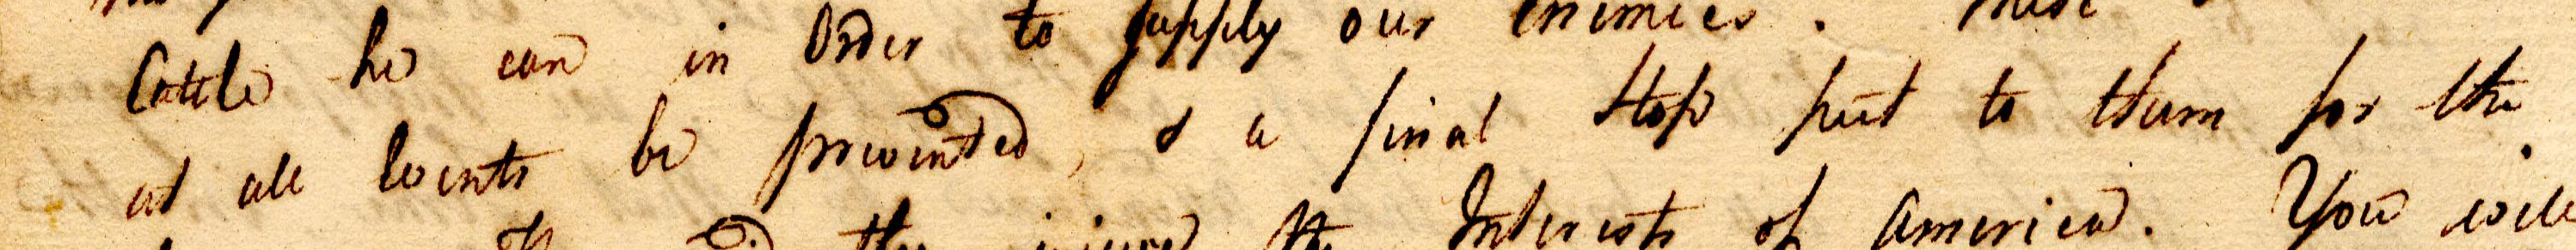at all Events be prevented, & a final Stop put to them for the
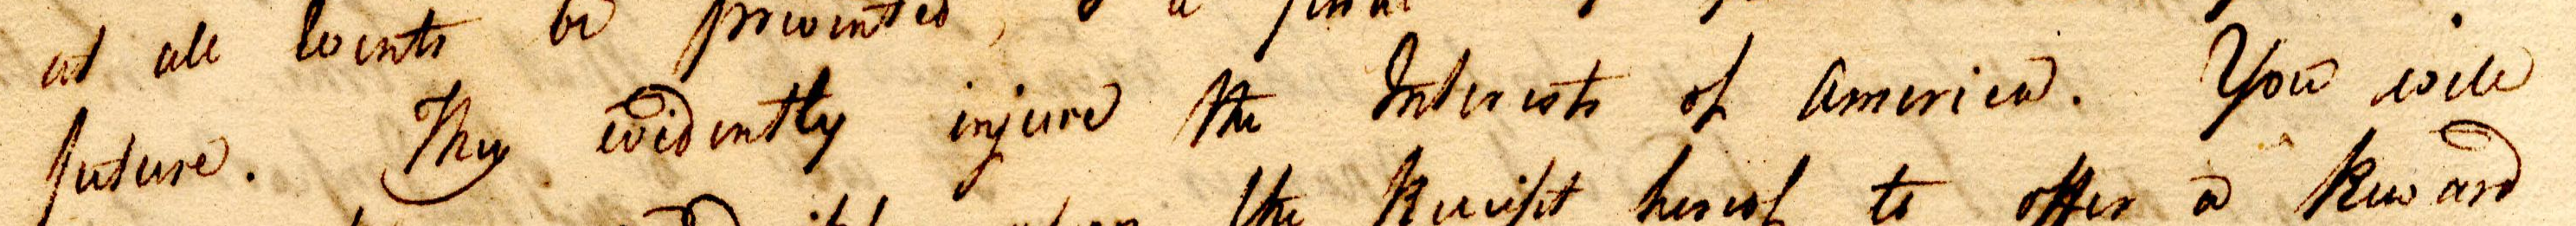future. They evidently injure the Interests of America. You will
